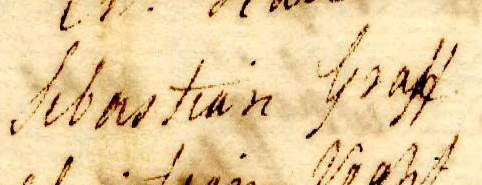Sebastian Graff
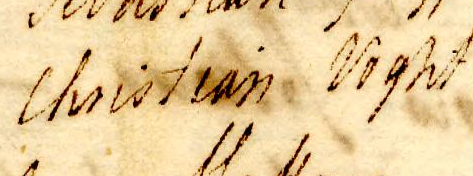Christian Voght
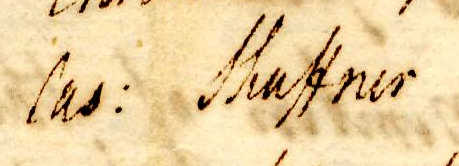Cas: Shaffner
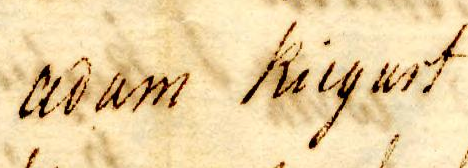Adam Ricgurt
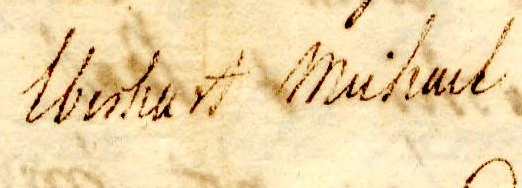Eberhart Michael
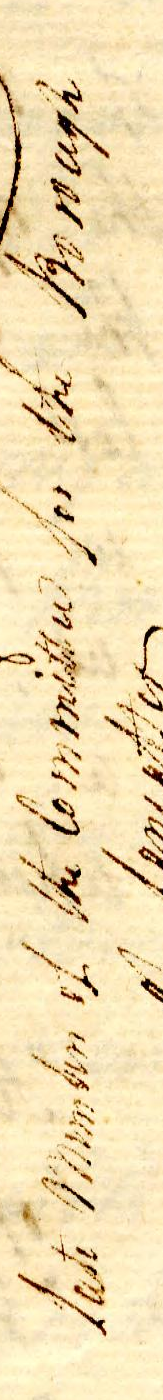Late Member of the Committee for the Borough
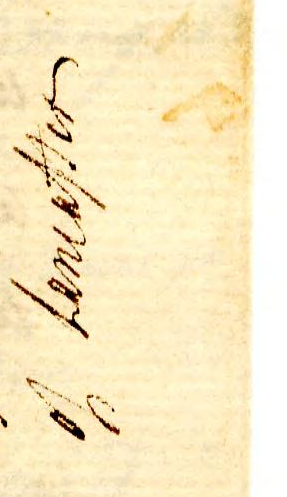of Lancaster
